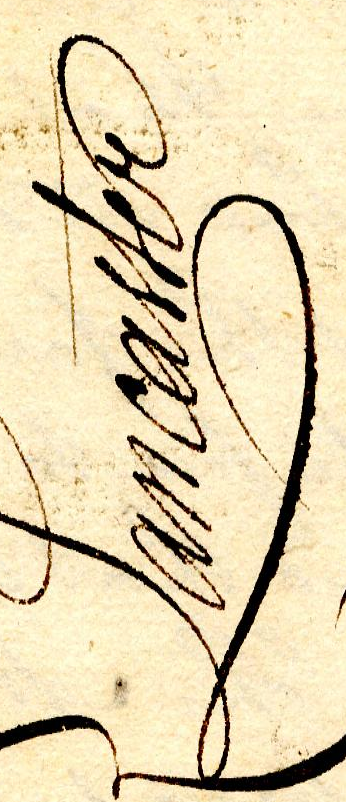Lancaster
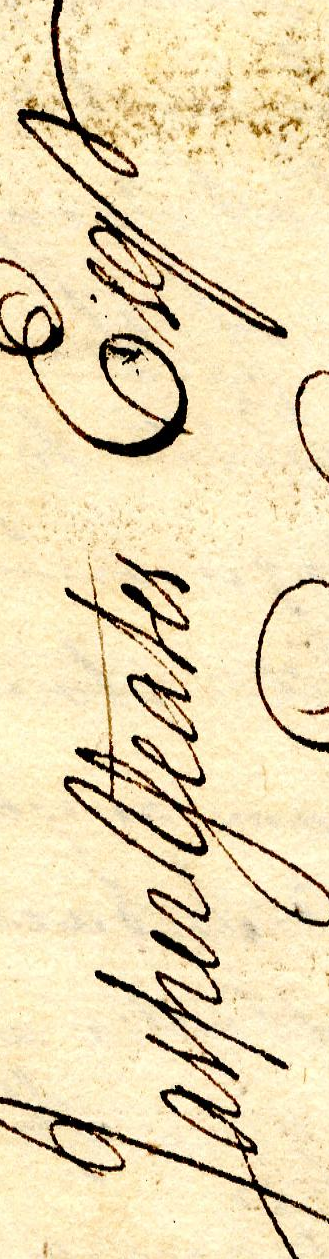Jasper Yeates Esq^r
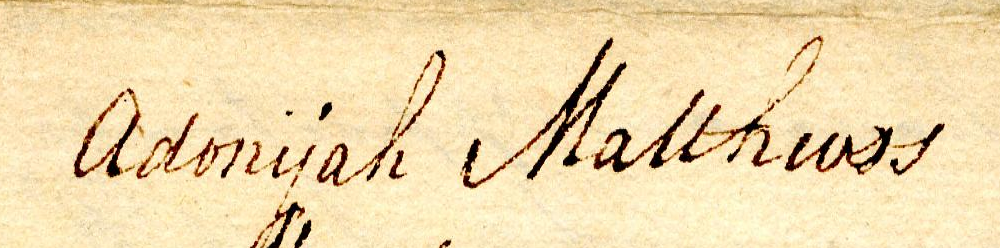Adonijah Matthews
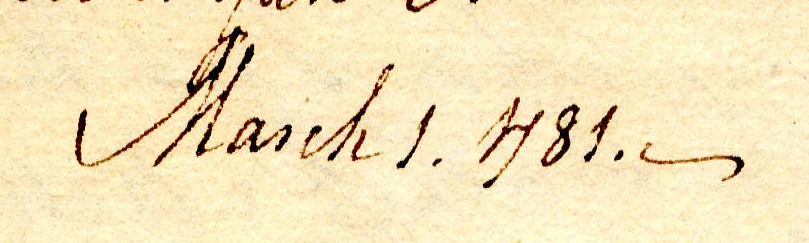March 1. 1781.
